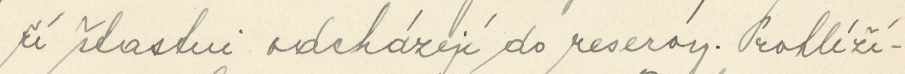ří šťastni odcházejí do reservy. Prohlíží-
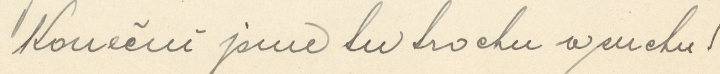Konečně jsme tu trochu v suchu!
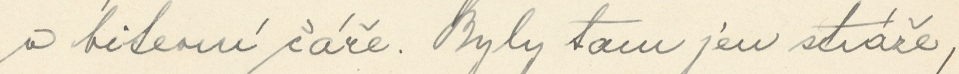v bitevní čáře. Byly tam jen stráže,
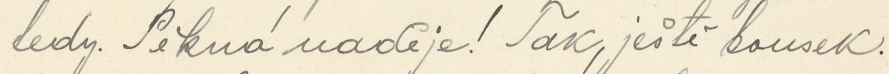tedy. Pěkná naděje! Tak ještě kousek.
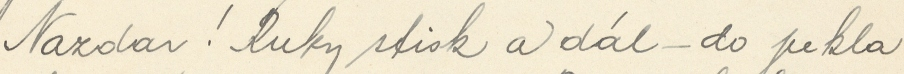Nazdar! Ruky stisk a dál - do pekla
